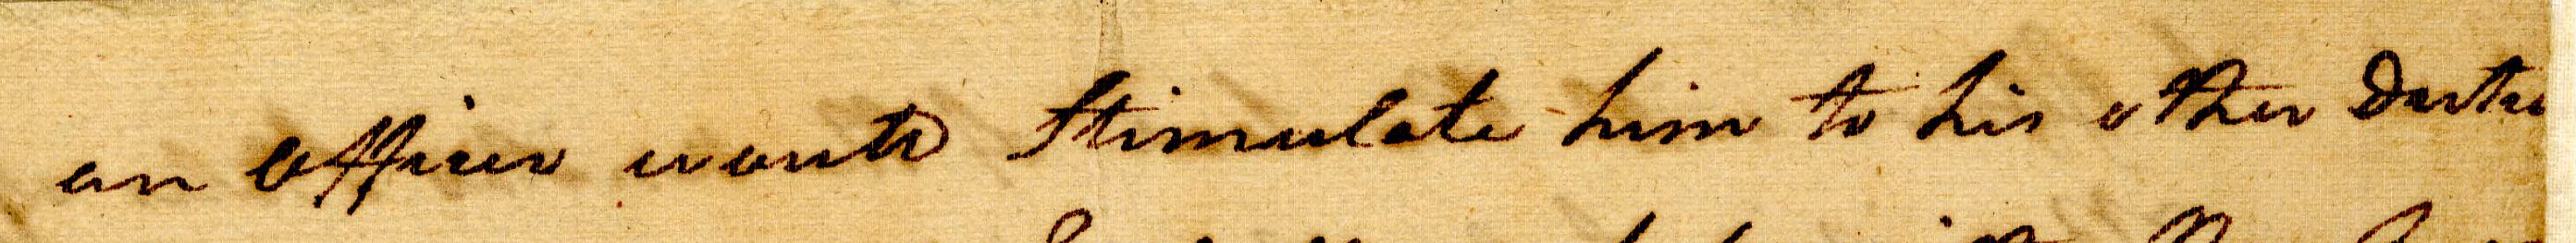an officer would stimulate him to his other duties
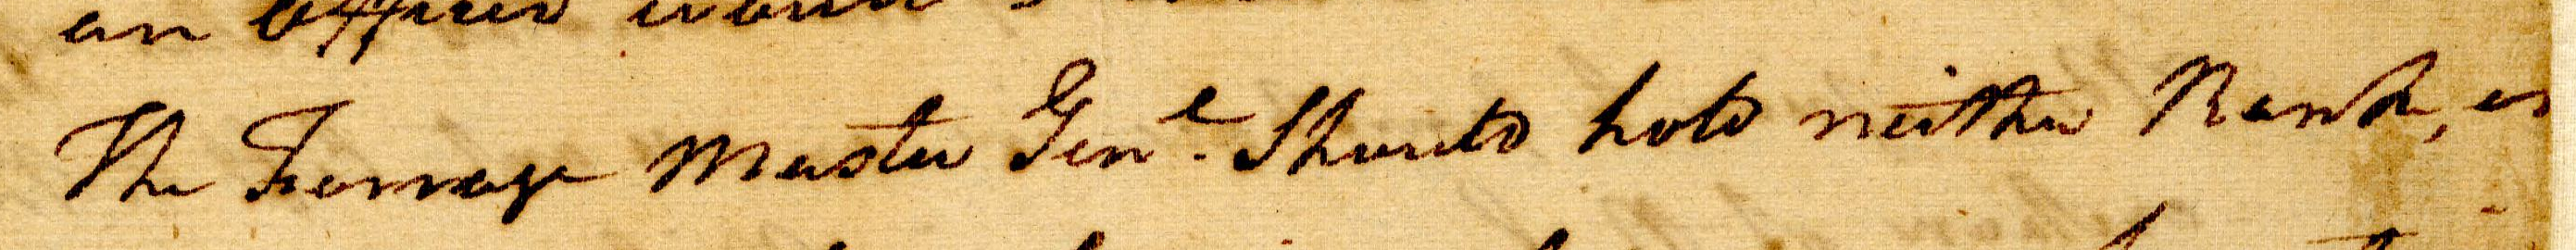The Forrage master Gen^l. should hold neither Rank, or
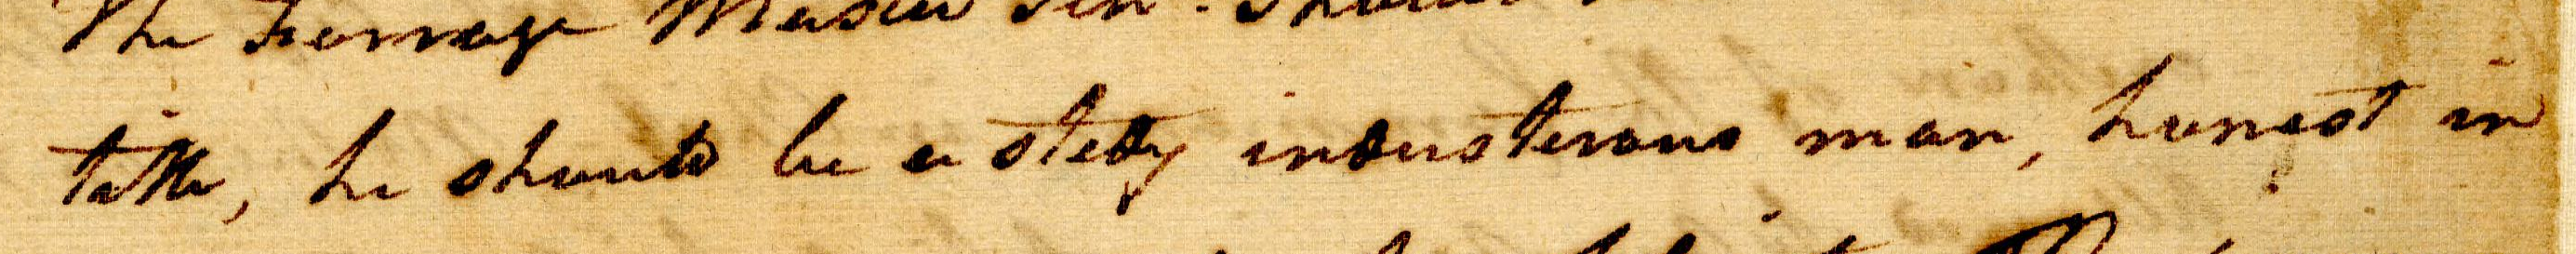title, he should be a stedy industrous man, honest in
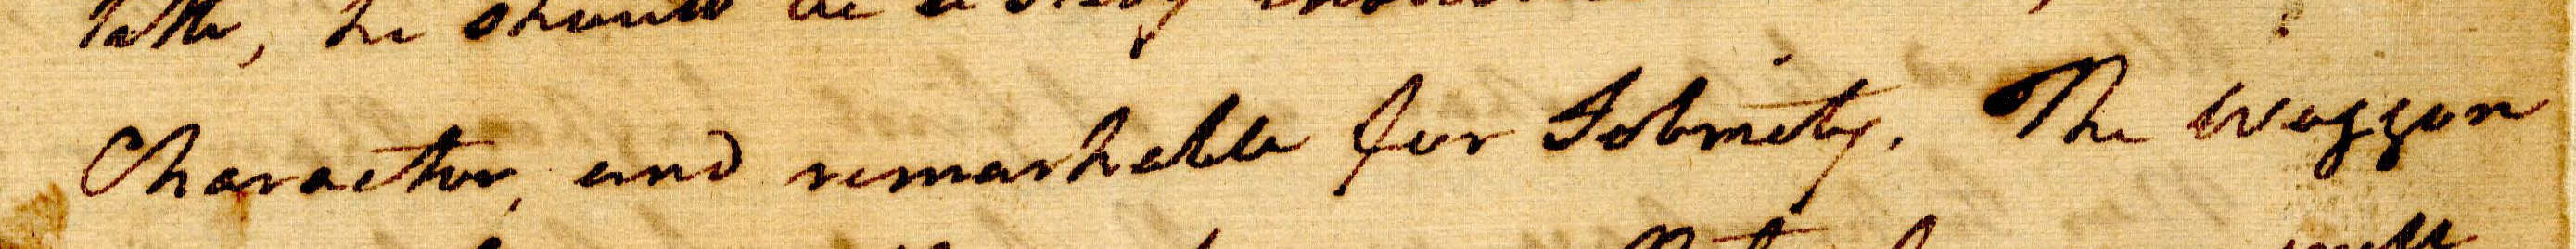Character, and remarkable for Sobriety. The waggon
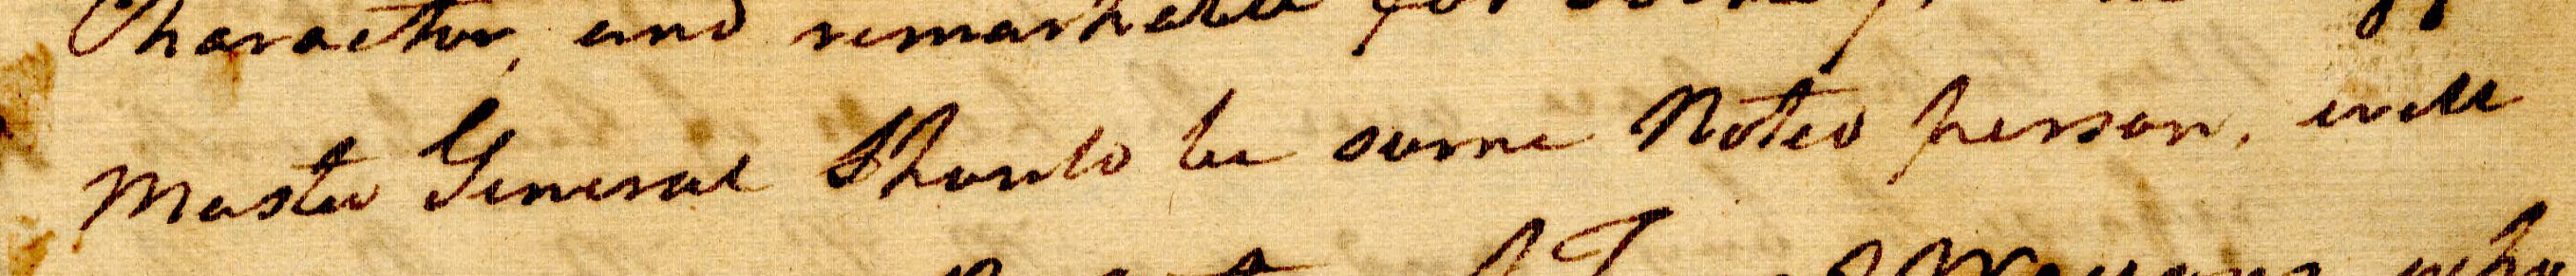master General should be some noted person, well
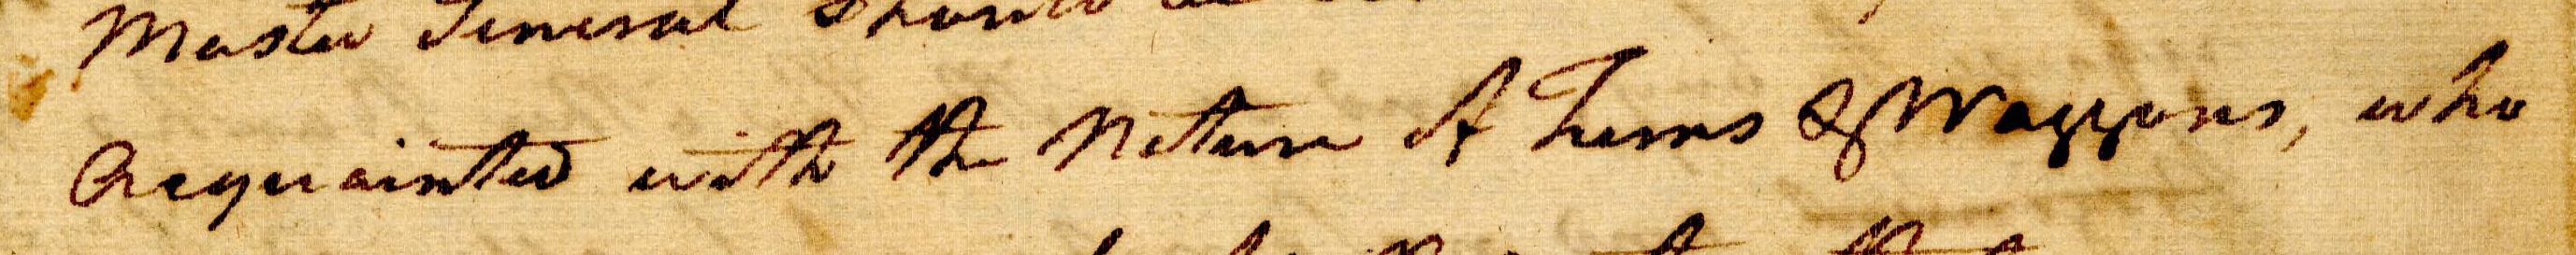acquaintted with the natture of Teams & Waggons, who
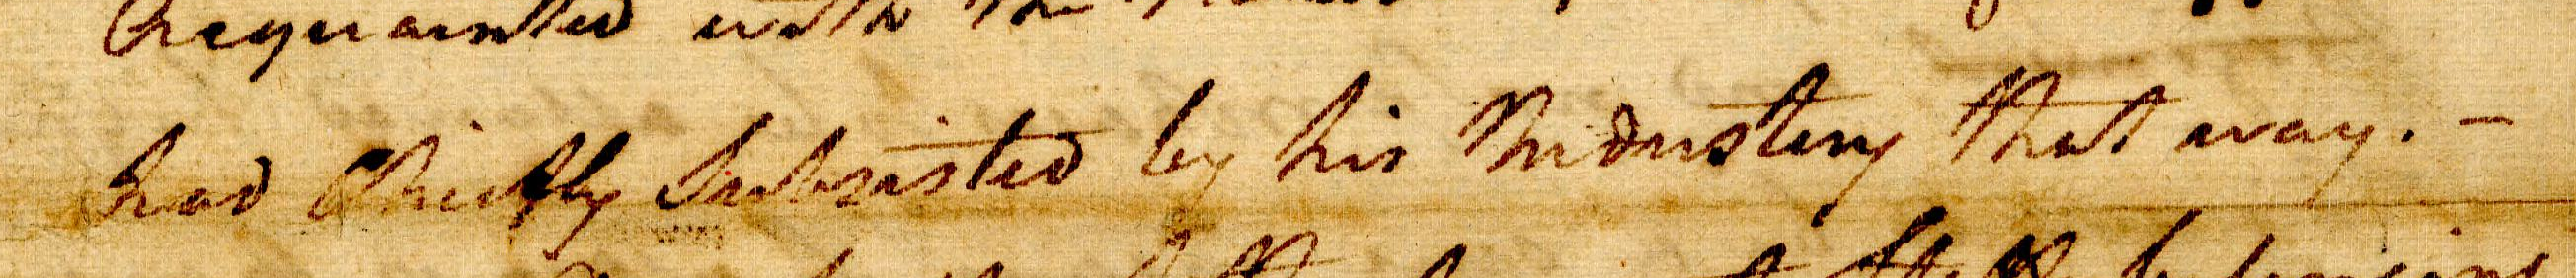had Chiefly Subsisted by his Industry that way.-
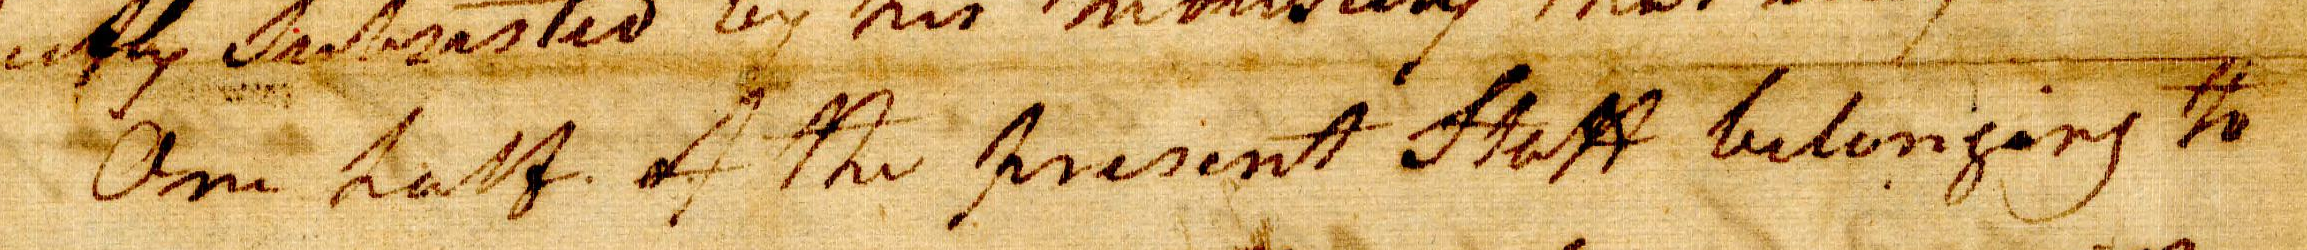One half of the present Staff belonging to
